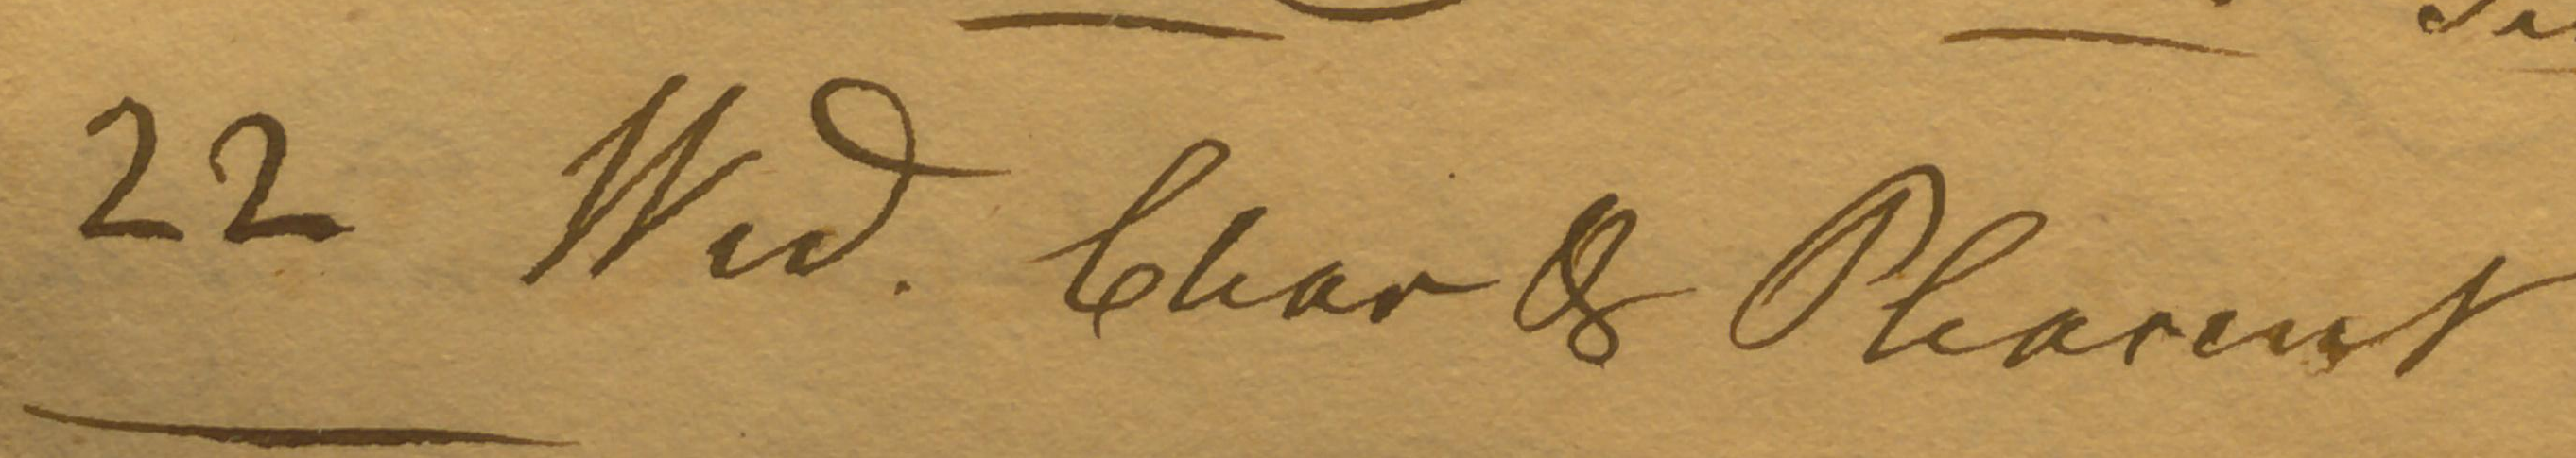22 Wed. Clear & Pleasent
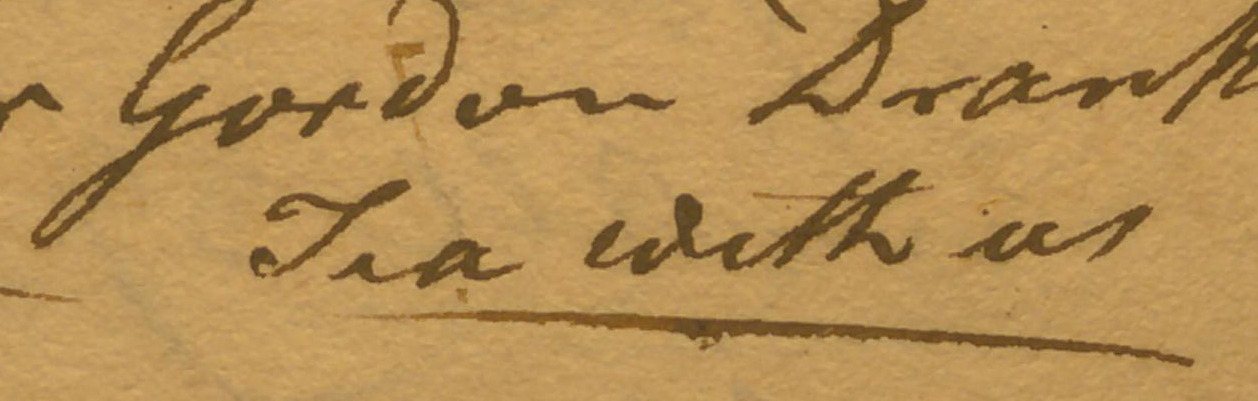Tea with us
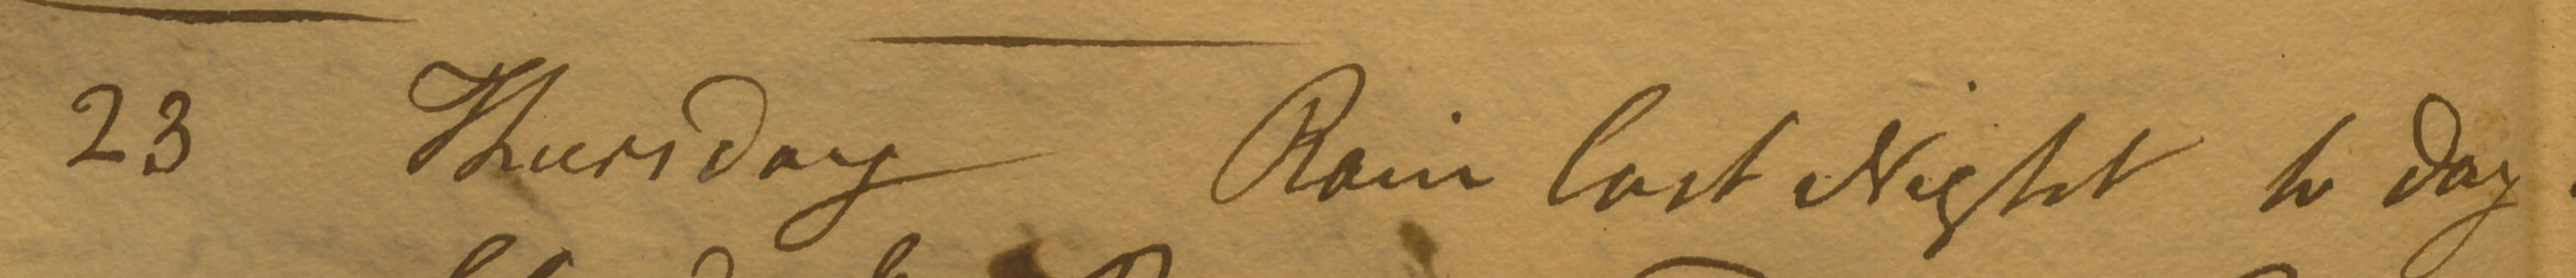28 Thursday Rain last Night to day
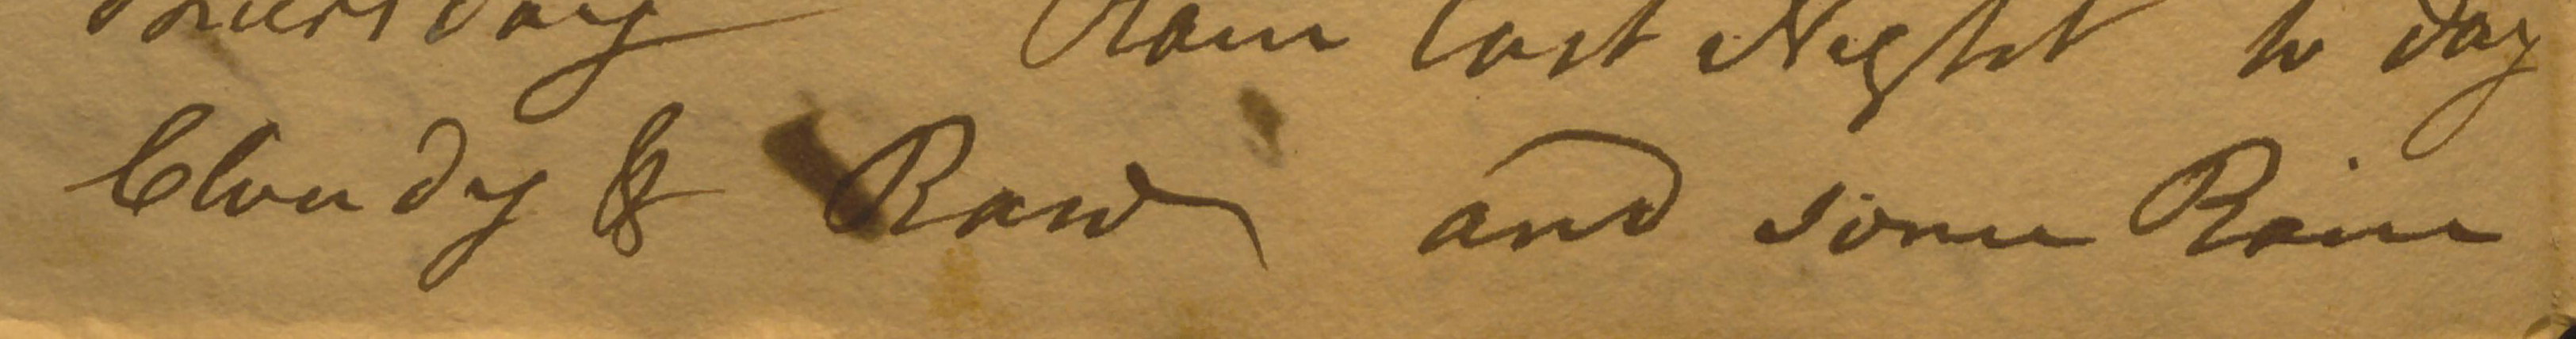Cloudy & Raw and some Rain
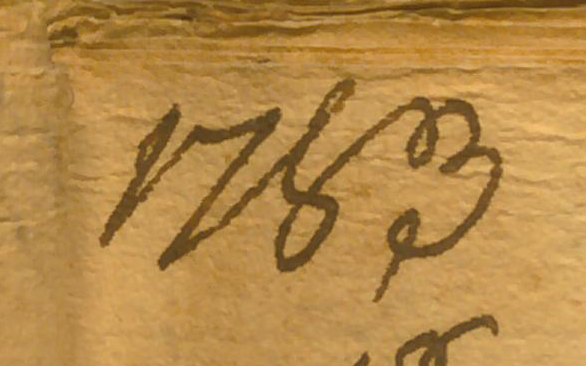1783
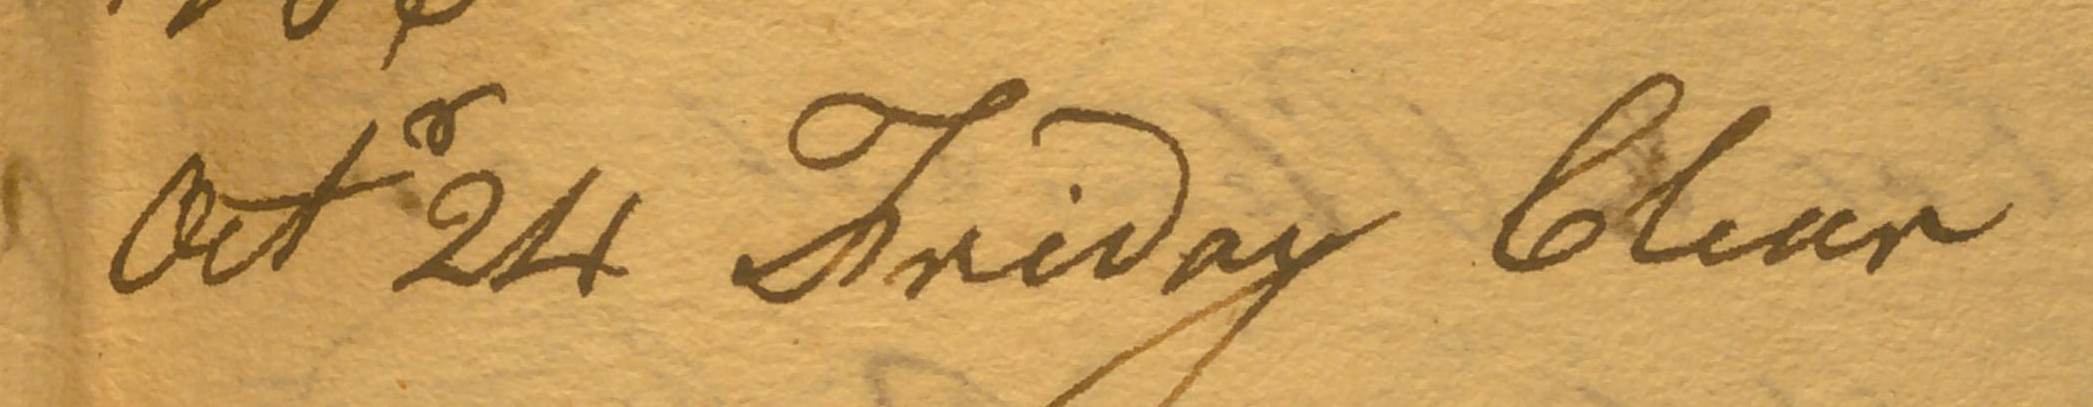Oct^r 24 Friday Clear
